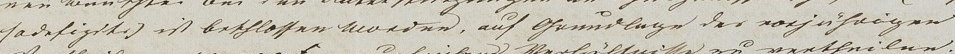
sadefizits) ist beschlossen worden, auf Grundlage der vorjährigen
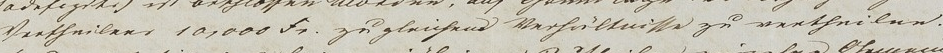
Vertheilens 10,000 Fr. zu gleichem Verhältnisse zu vertheilen.
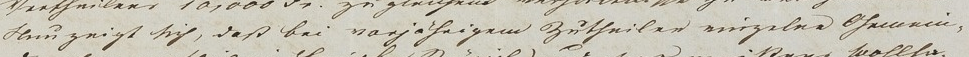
Nun zeigt sich, daß bei vorjährigem Zutheilen einzelne Gemein-
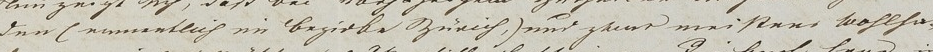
den (namentlich im Bezirke Zürich,) und zwar meistens wohlha-
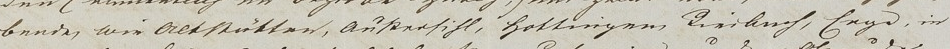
bende, wie Altstätten, Außersihl, Hottingen, Riesbach, Enge, in
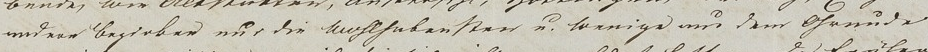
andern Bezirken nur die wohlhabensten u. wenige aus dem Grunde
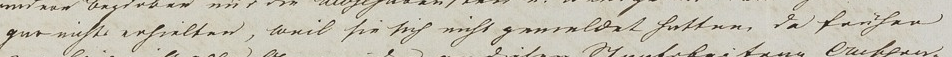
gar nichts erhielten, weil sie sich nicht gemeldet hatten, da früher
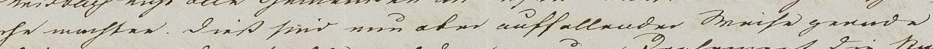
che machten. Dieß sind nun aber auffallender Weise gerade
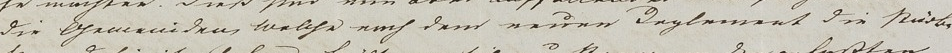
die Gemeinden, welche nach dem neuen Reglement die stärk-
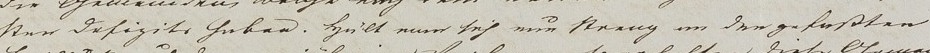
sten Defizits haben. Hält man sich nun streng an den gefaßten
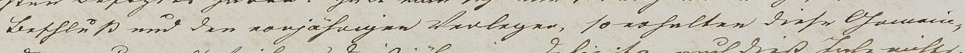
Beschluß und den vorjährigen Verleger, so erhalten diese Gemein-
